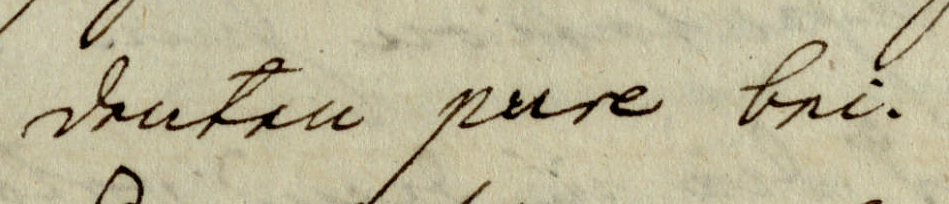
denten pure bei.
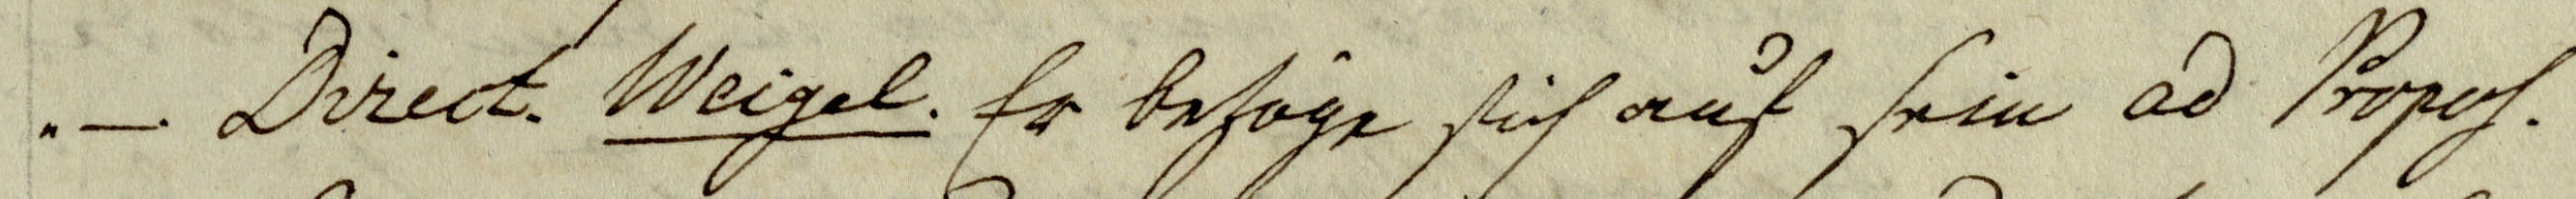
" — . Direct. Weigel. Er bezöge sich auf sein ad Propos.
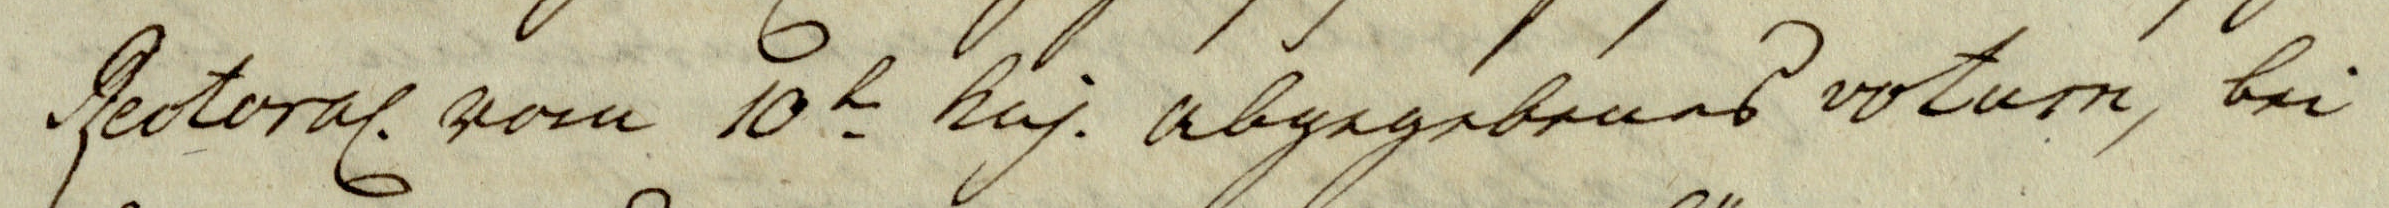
Rectoral. vom 10t. huj. abgegebenes votum, bei
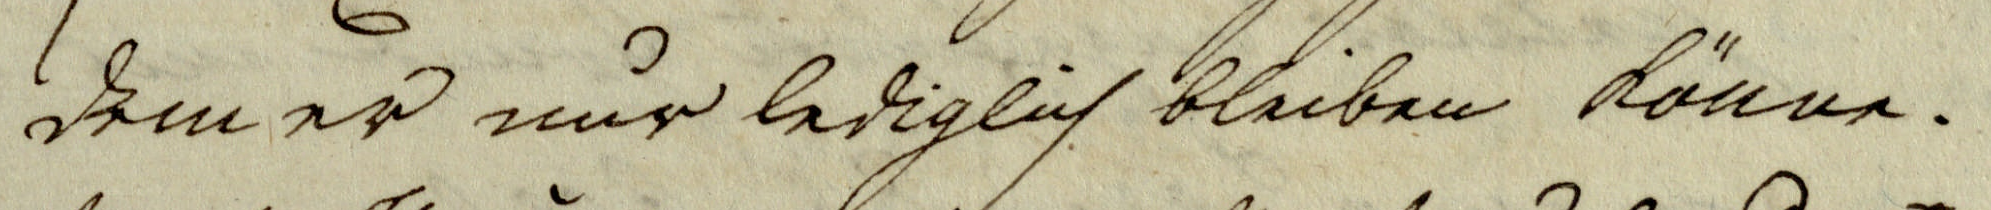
dem er nur lediglich bleiben könne.
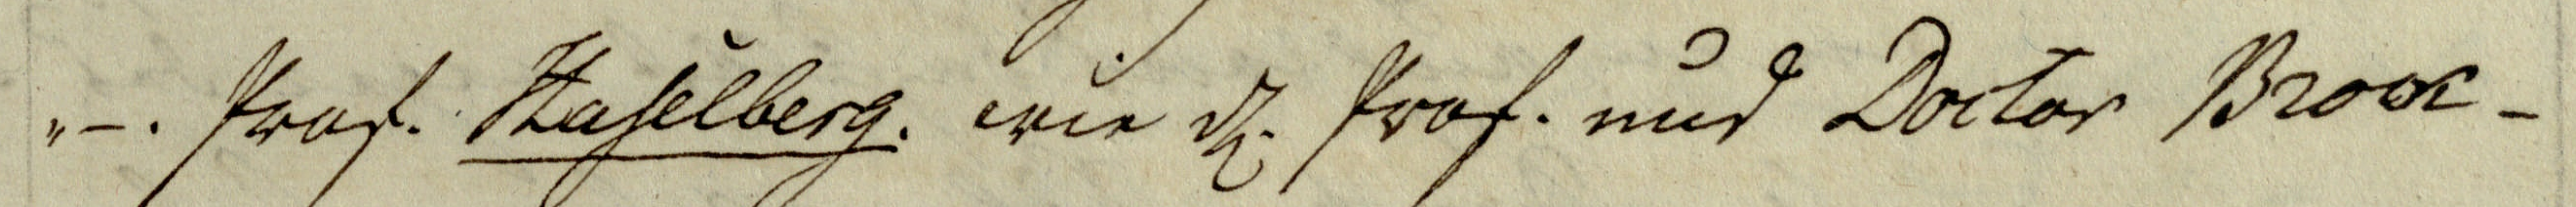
" — . Prof. Haselberg. wie dh. Prof. und Doctor Brock¬
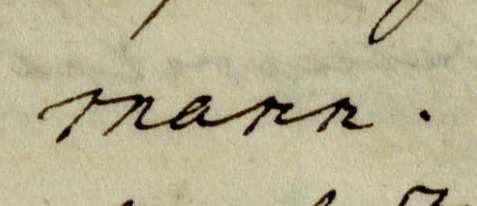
mann.
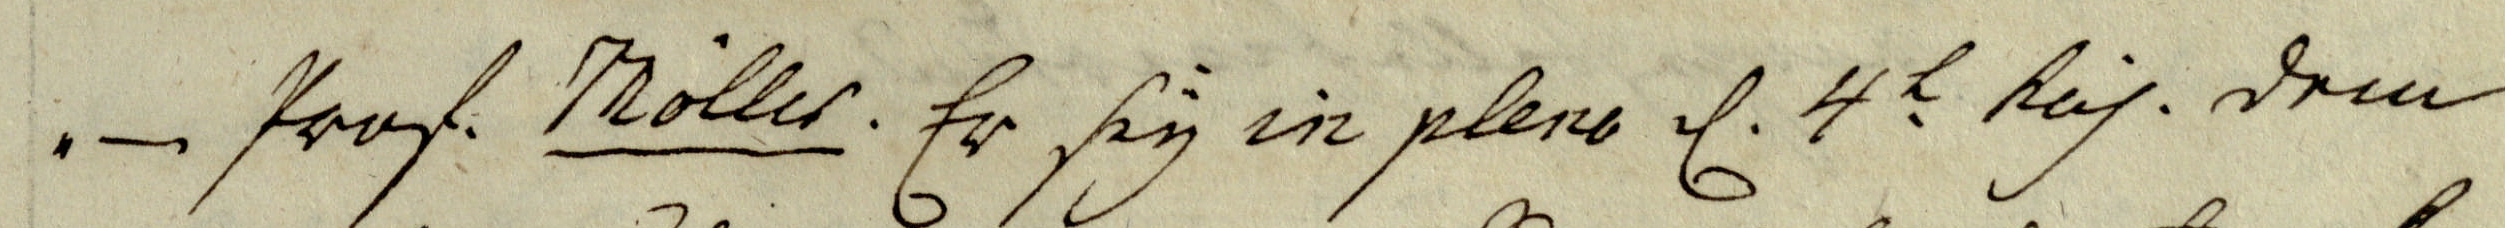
" — . Prof. Möller. Er seÿ in pleno d. 4t. huj. dem
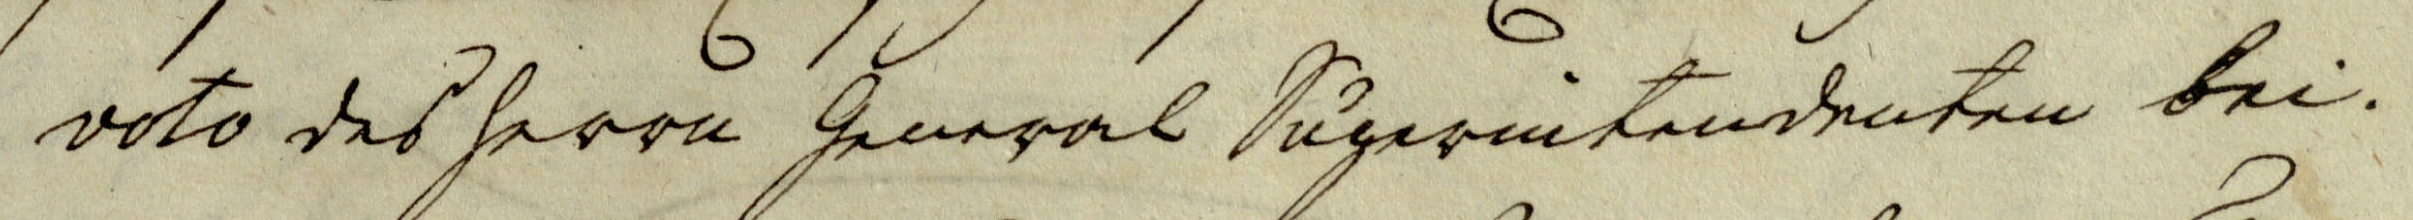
voto des Herrn General Superintendenten bei¬
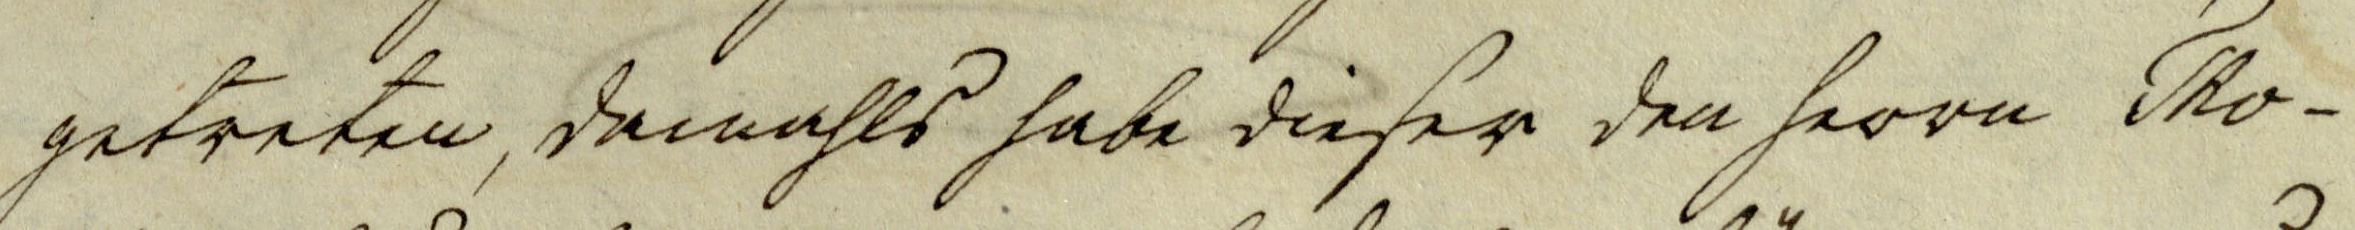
getreten, damahls habe dieser den Herrn Tho¬
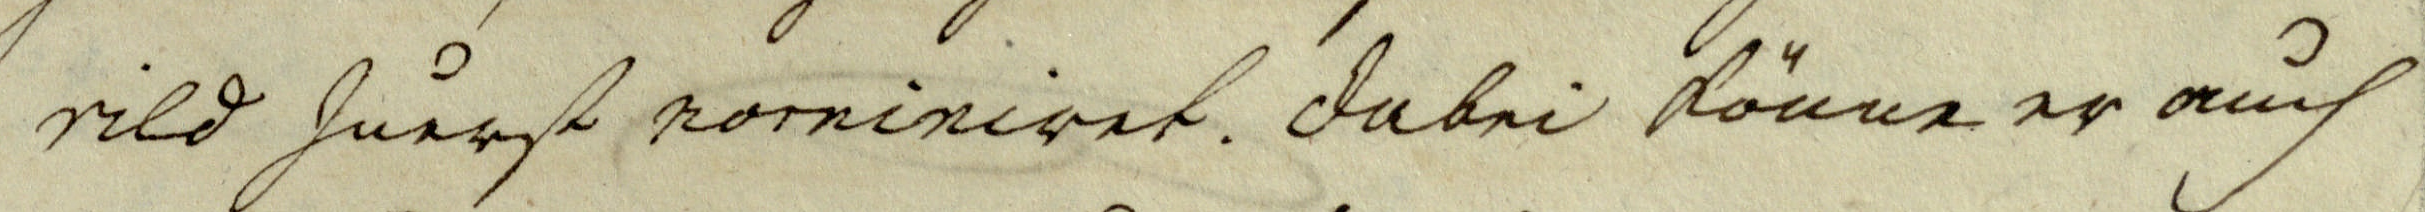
rild zuerst nominiret. Dabei könne er auch
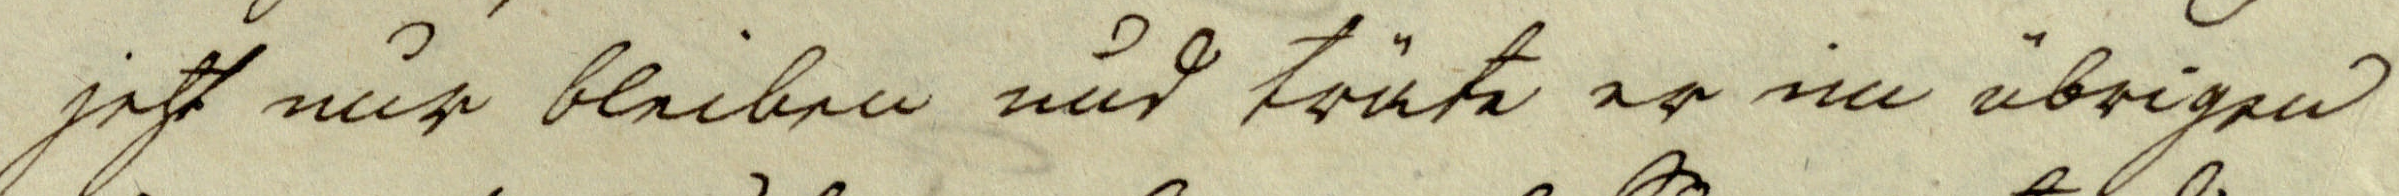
jetzt nur bleiben und träte er im übrigen
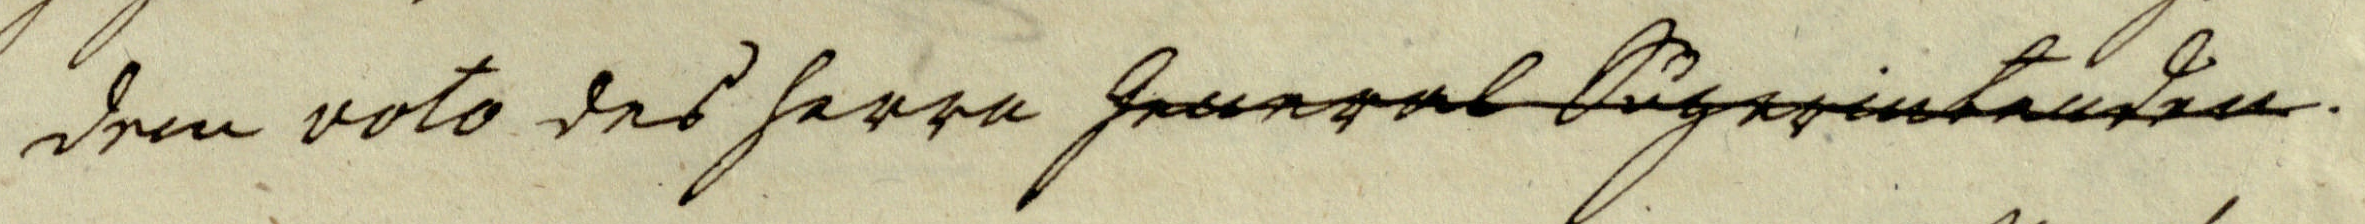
dem voto des Herrn General Superintendenten
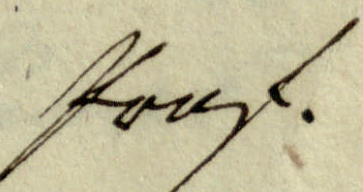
Prof.
